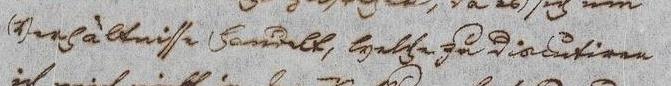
Verhältnisse handelt, welche zu discutiren
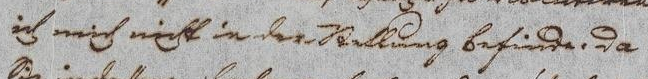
ich mich nicht in der Stellung befinde. Da
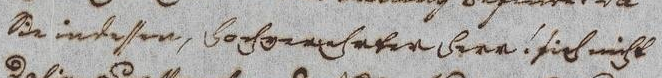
Sie indessen, hochverehrter Herr! sich nicht
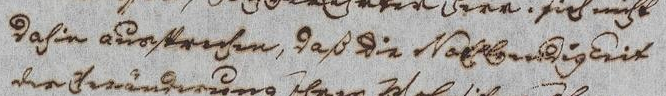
dahin aussprechen, daß die Nothwendigkeit
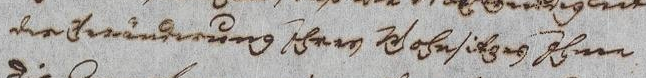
der Veränderung Ihres Wohnsitzes Ihnen
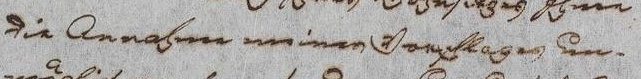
die Annahme meines Vorschlages un-
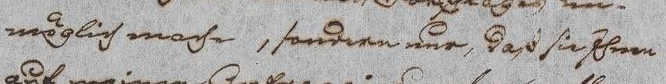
möglich machen, sondern nur, daß sie Ihnen
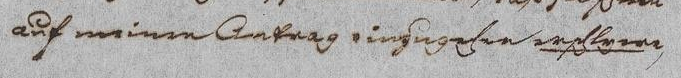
auf meinen Antrag einzugehen erschwere,
